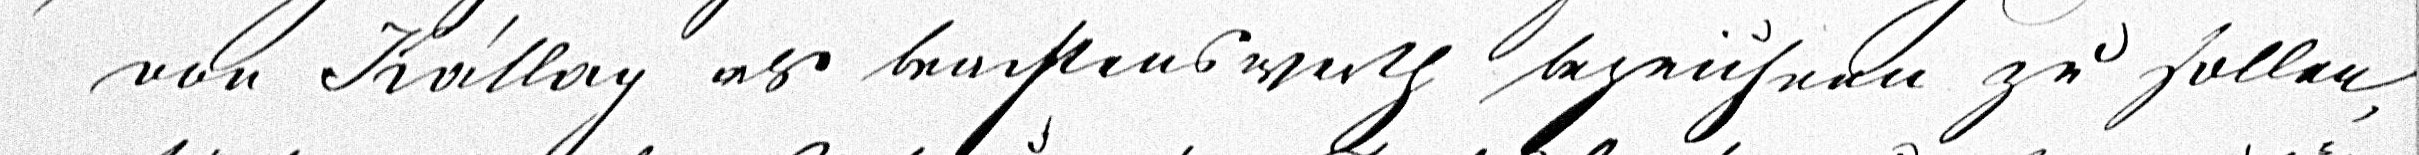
von Kállay als beachtenswerth bezeichnen zu Follen,
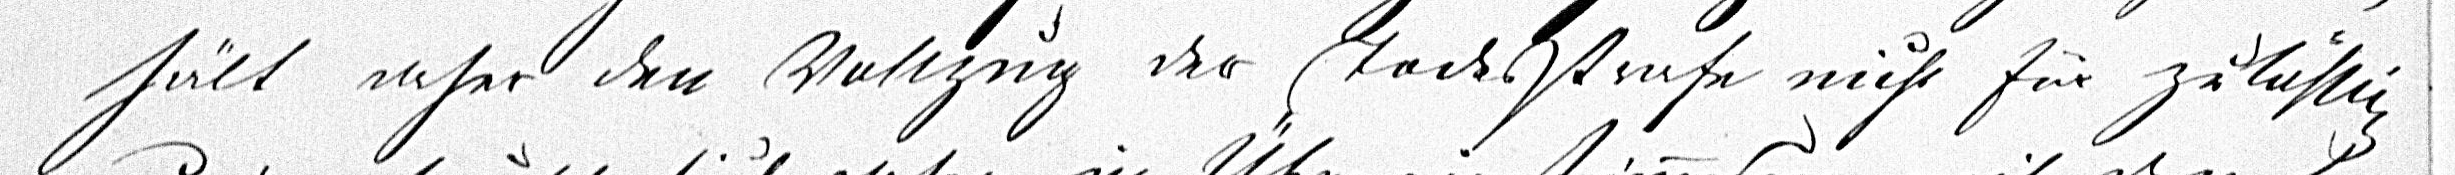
hält daher den Vollzug der Todesstrafe nicht für zulässig
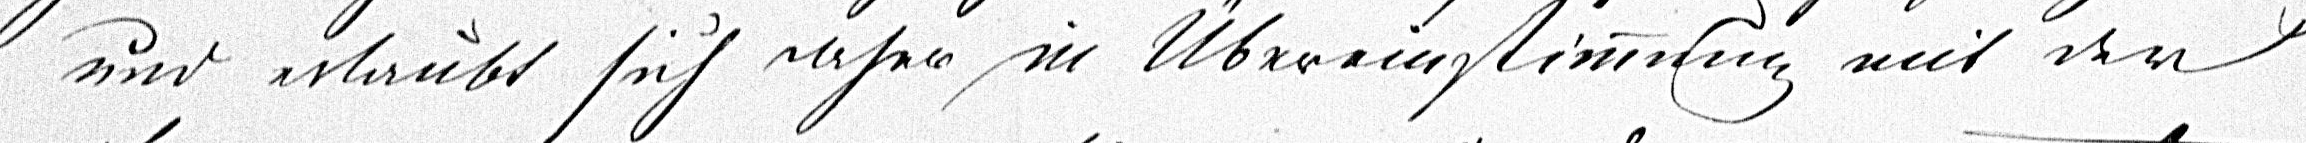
und erlaubt sich daher in Übereinstimmung mit der
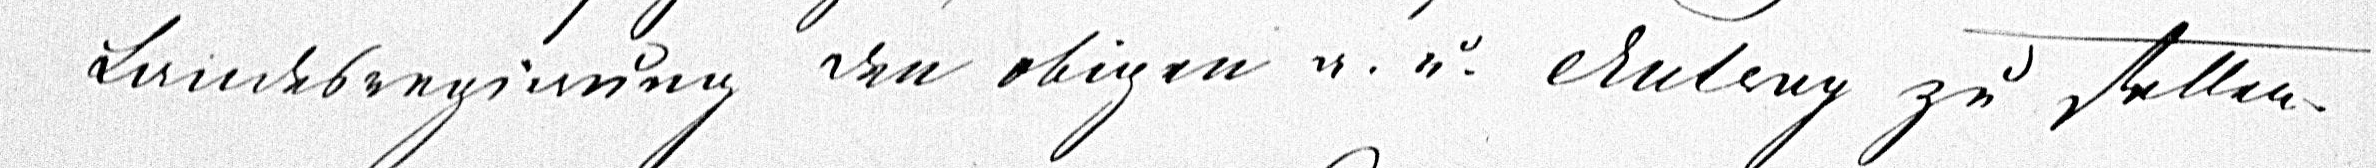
Landesregierung den obigen a. u. Antrag zu stellen.
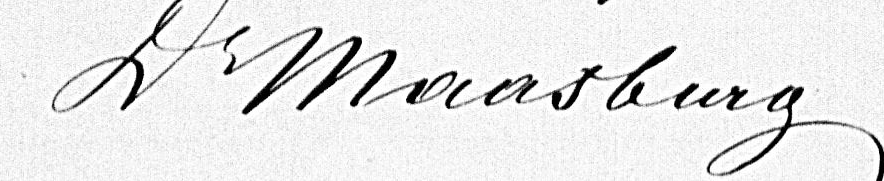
Dr Maasburg
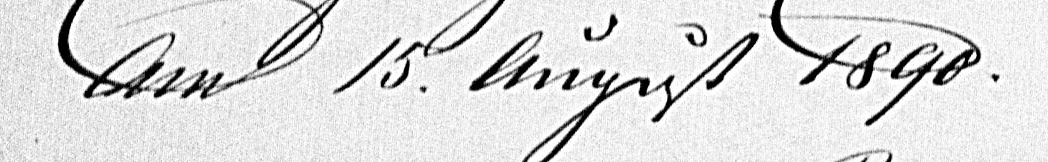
Am 15. August 1890.
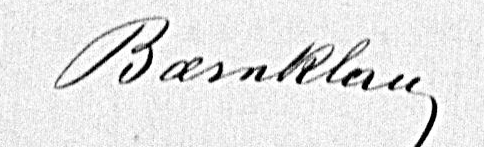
Barnklau
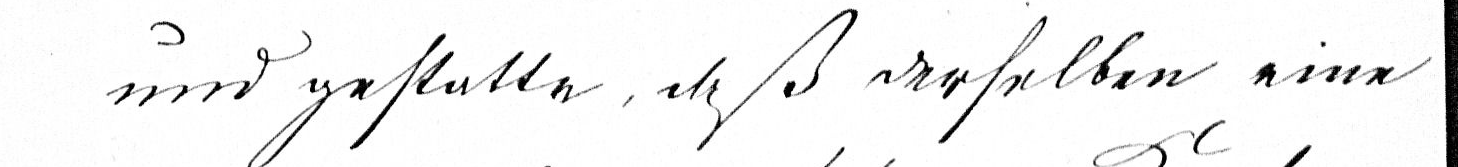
und gestatte, aß derselben eine
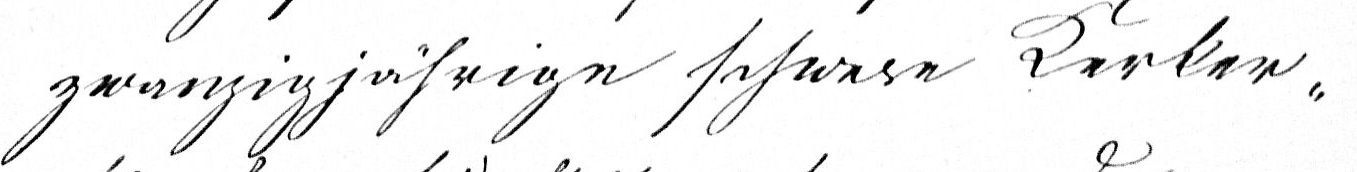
zwanzigjährige schwere Kerker¬
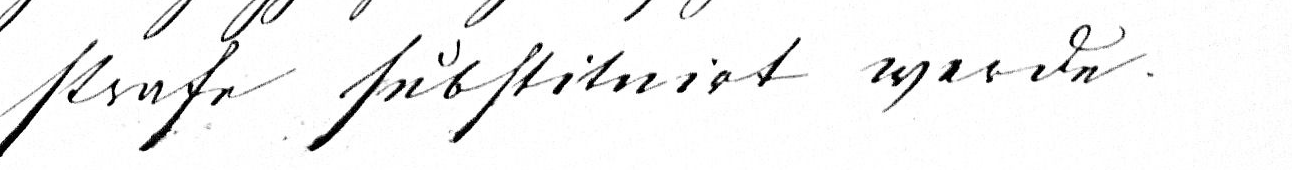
strafe substitert werde.
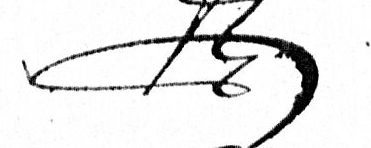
xx
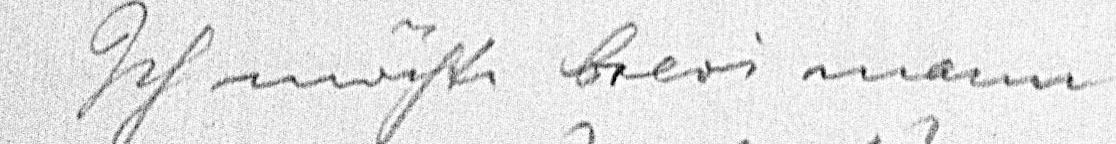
Ich möchte Brevimann
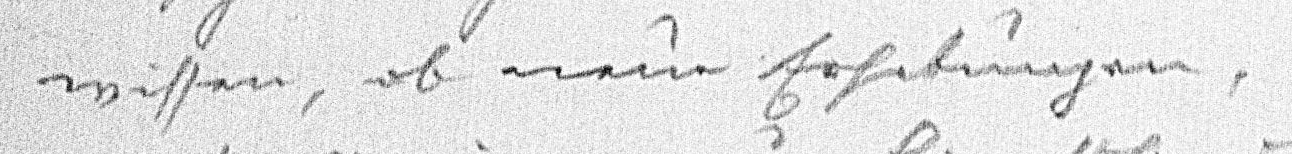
wissen, ob neue Erhebungen,
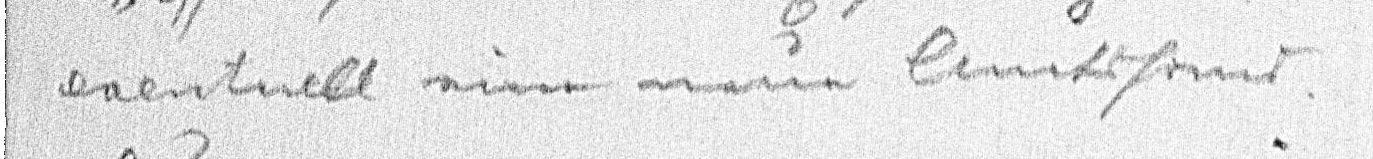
eventuell eine neue Amtshand¬
